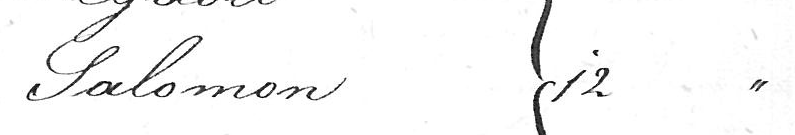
Salomon 12 "
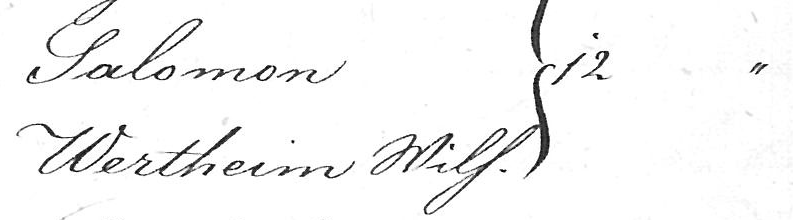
Wertheim Wilh. 12 "
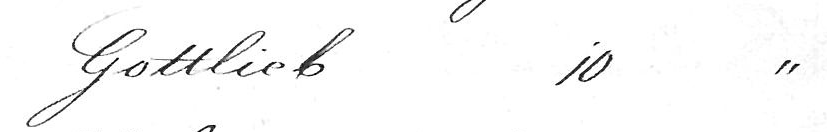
Gottlieb 10 "
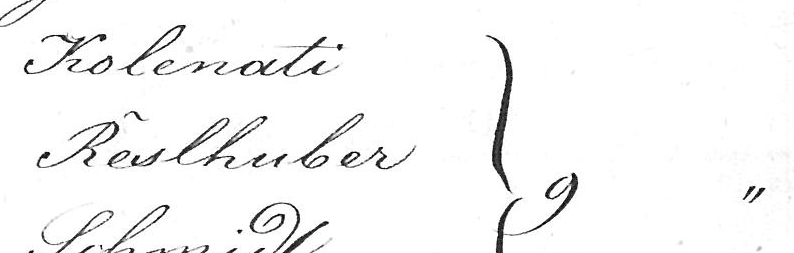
Kolenati 9 "
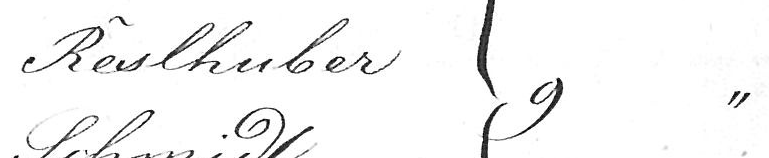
Reslhuber 9 "
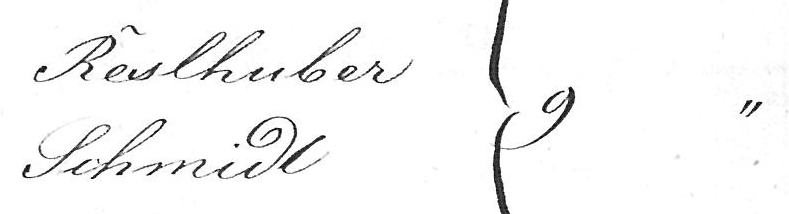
Schmidl 9 "
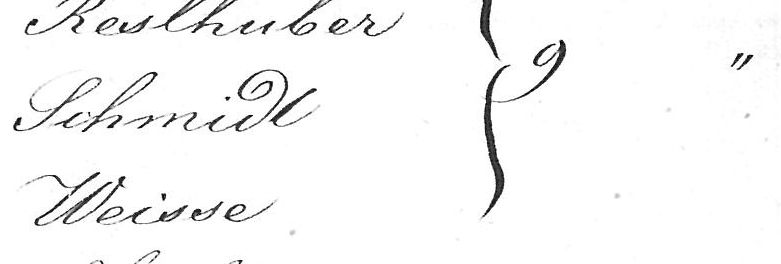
Weisse 9 "
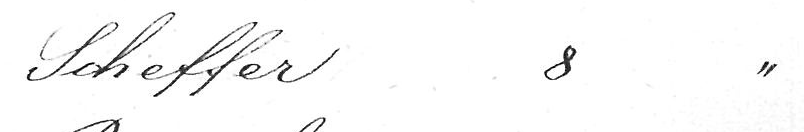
Scheffer 8 "
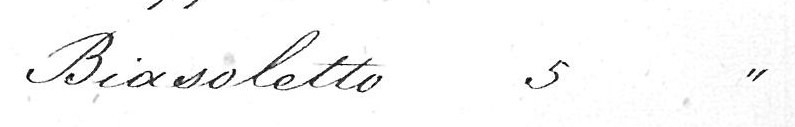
Biasoletto 5 "
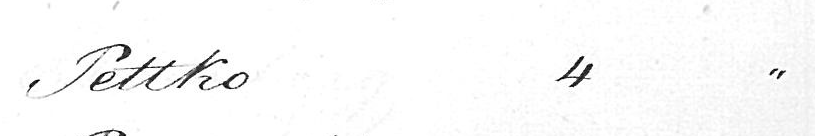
Pettko 4 "
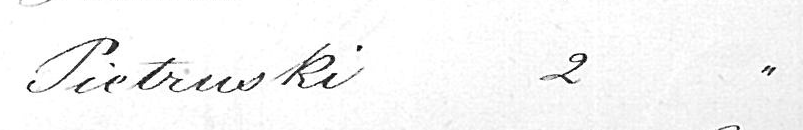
Pietruski 2 "
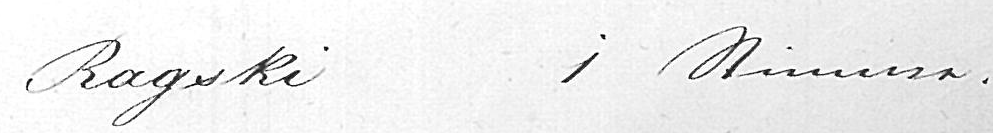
Ragski 1 Stimme
